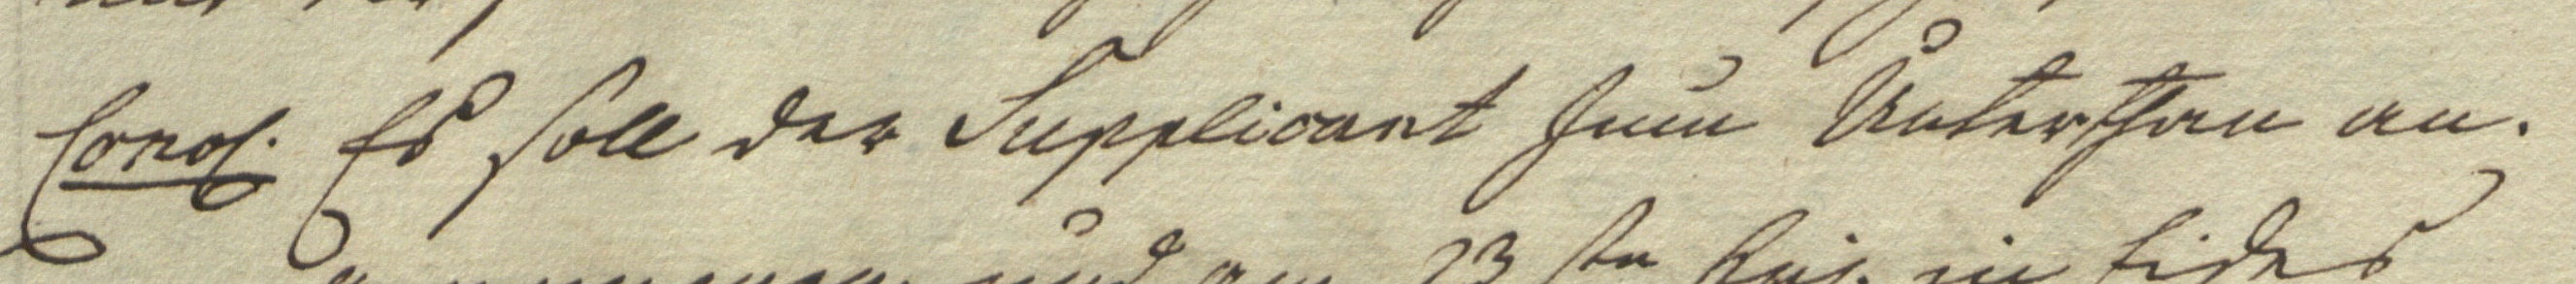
Concl. Es soll der Supplicant zum Unterthan an¬
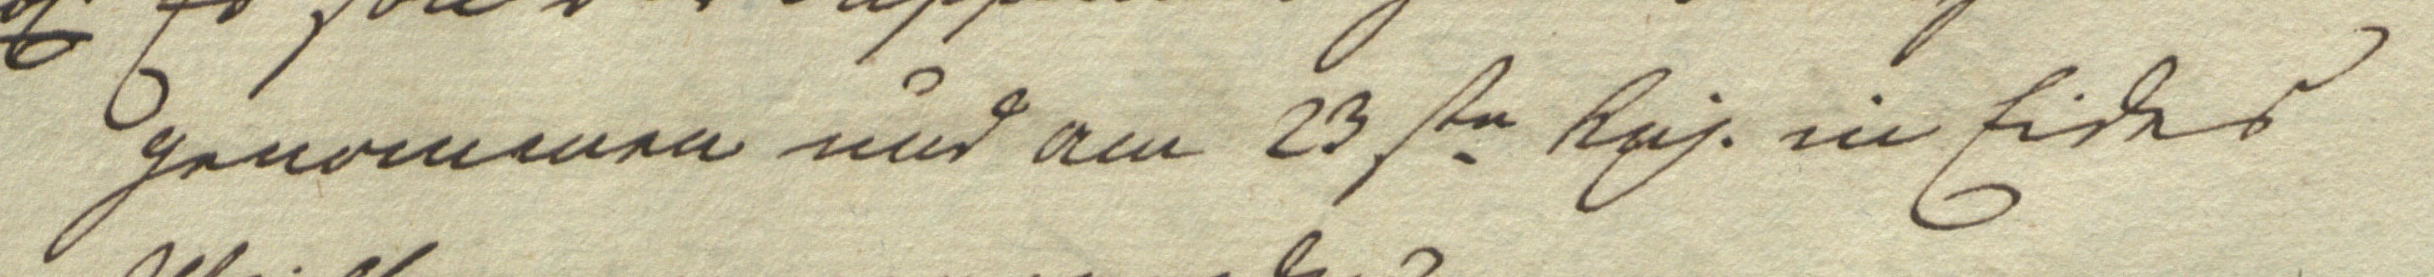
genommen und am 23 sten huj. in Eides
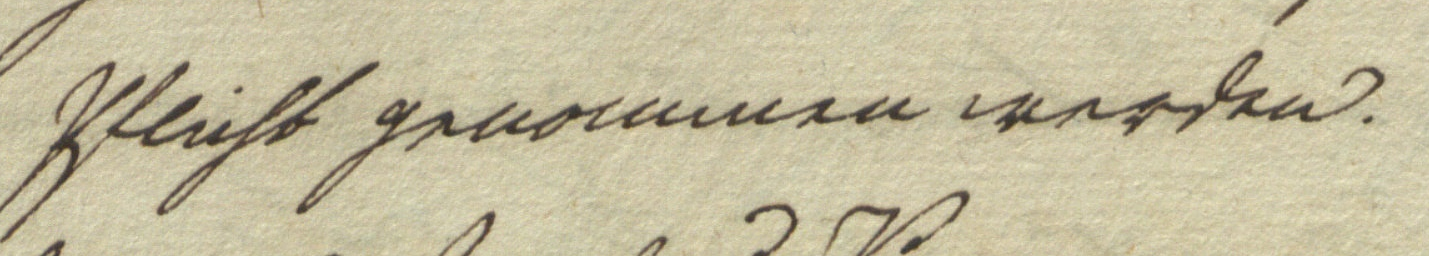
Pflicht genommen werden.
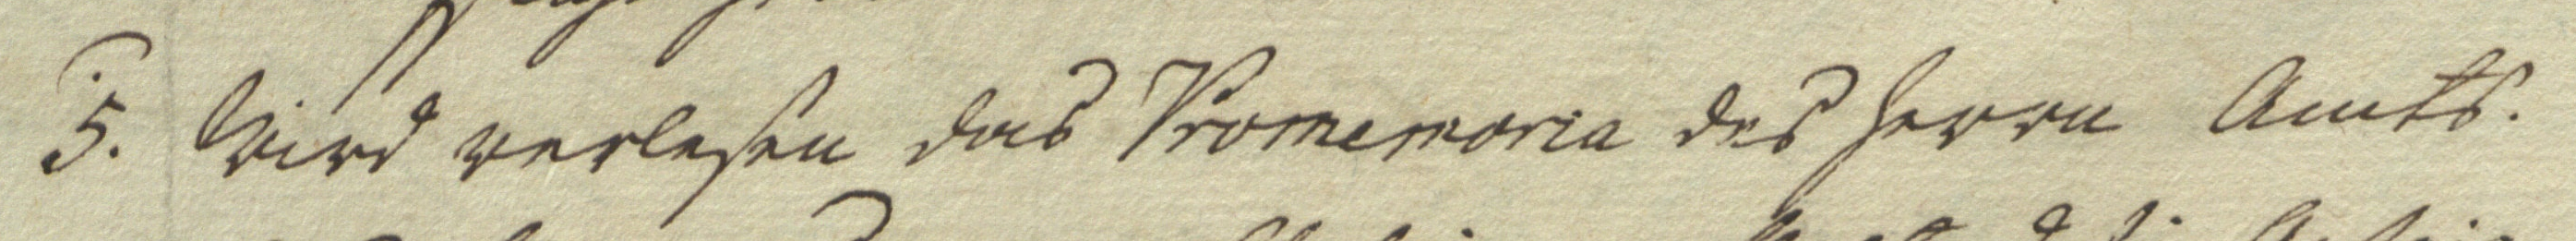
5. Wird verlesen das Promemoria des Herrn Amts¬
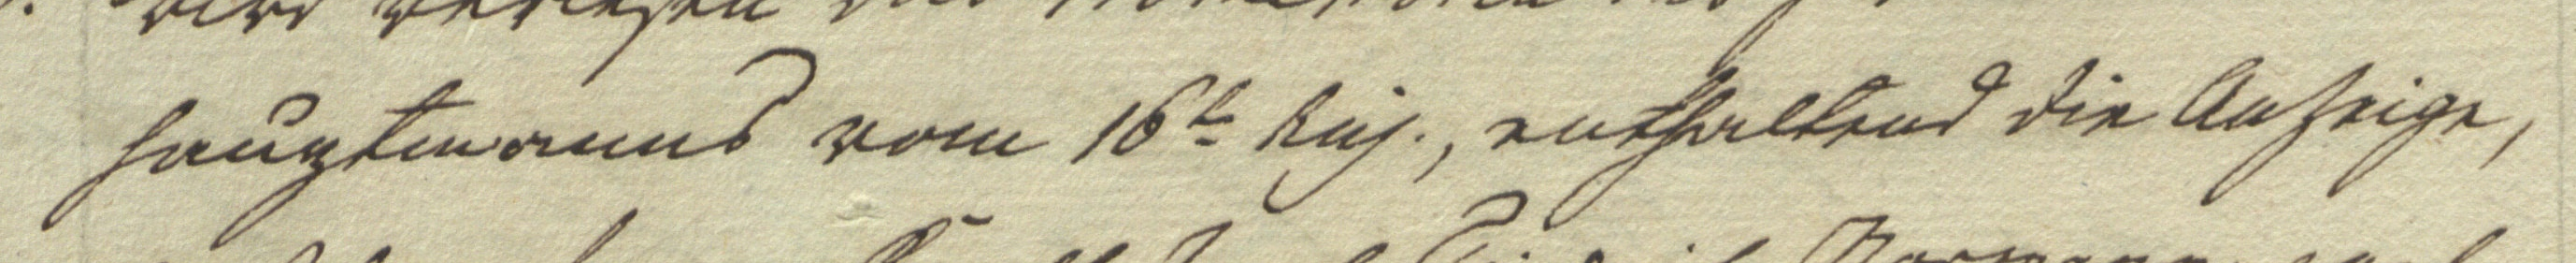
hauptmanns vom 16 ten huj., enthaltend die Anzeige,
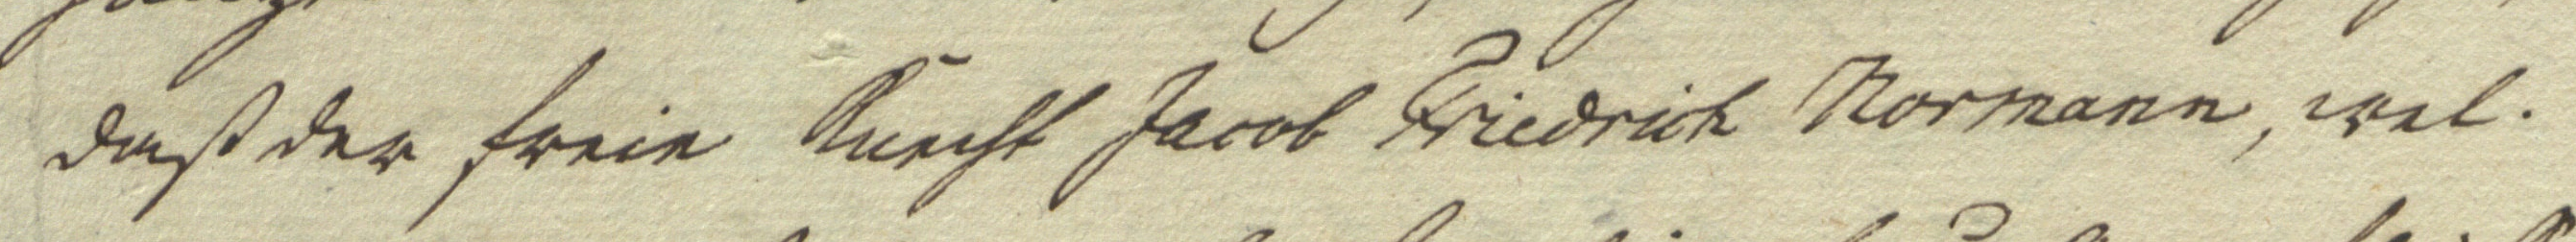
daß der freie Knecht Jacob Friedrich Normann, wel¬
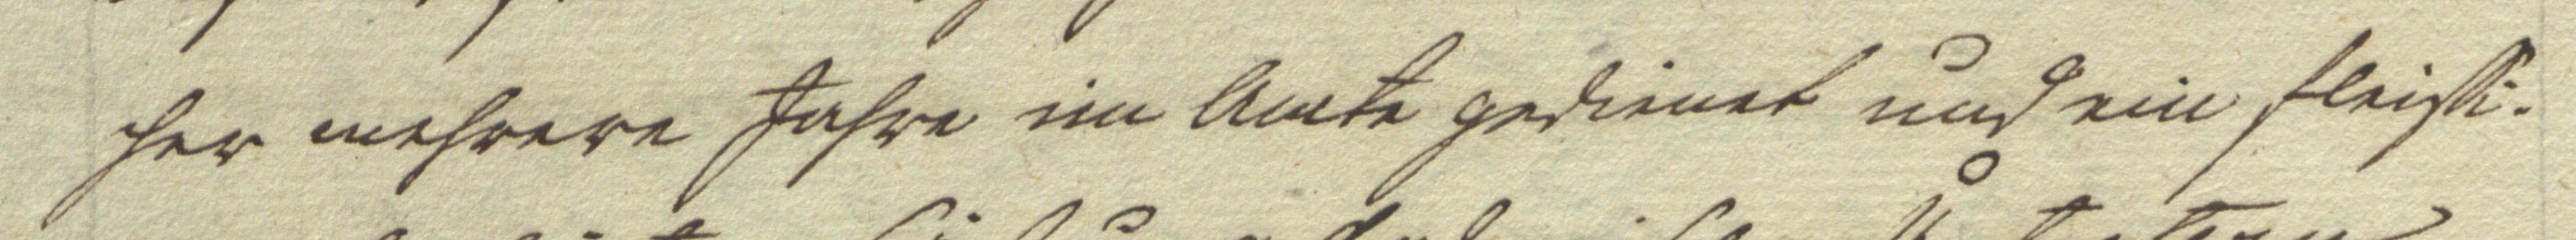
cher mehrere Jahre im Amte gedienet und ein fleissi¬
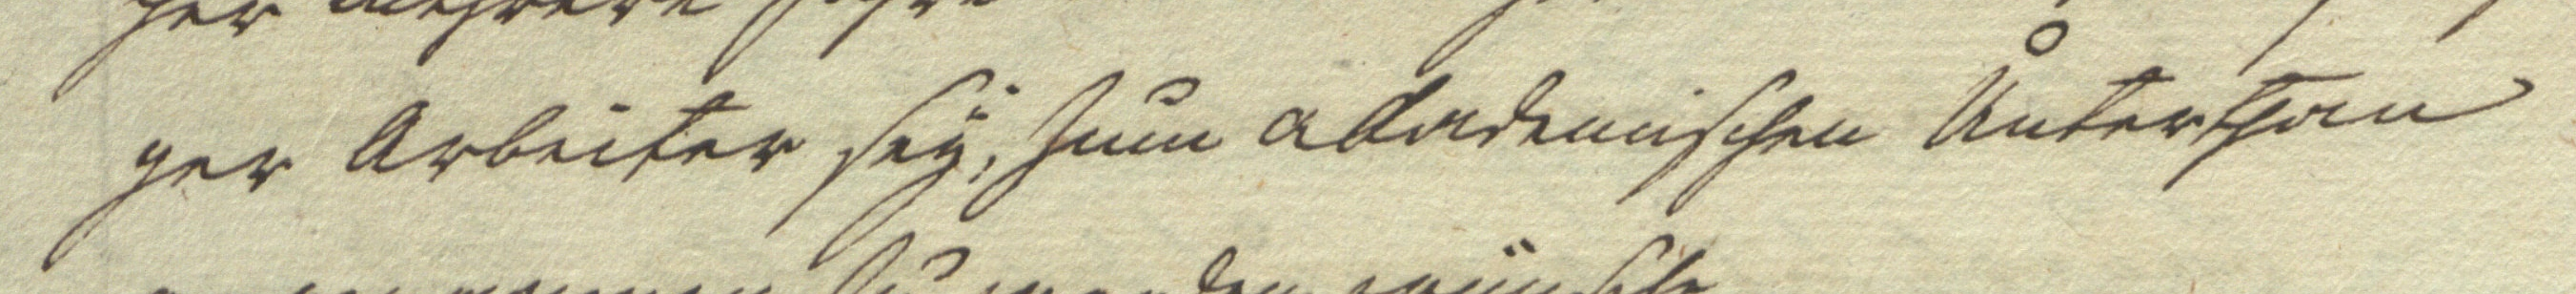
ger Arbeiter seÿ, zum akademischen Unterthan
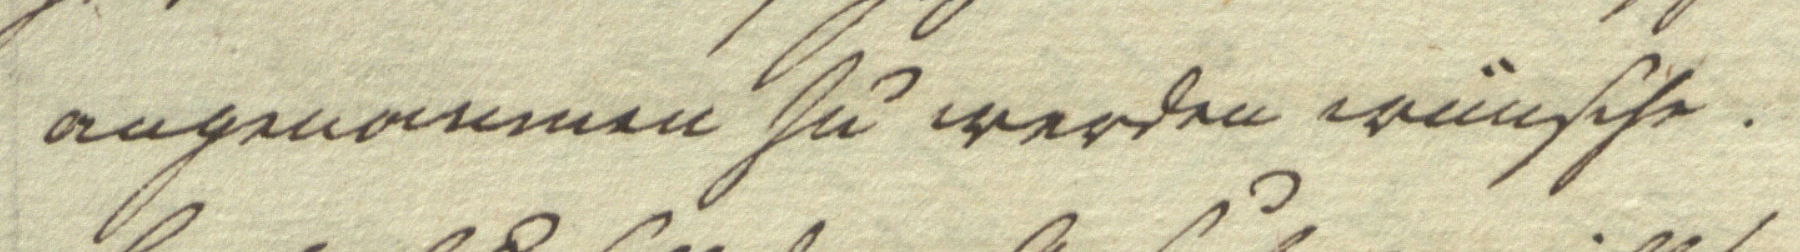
angenommen zu werden wünsche.
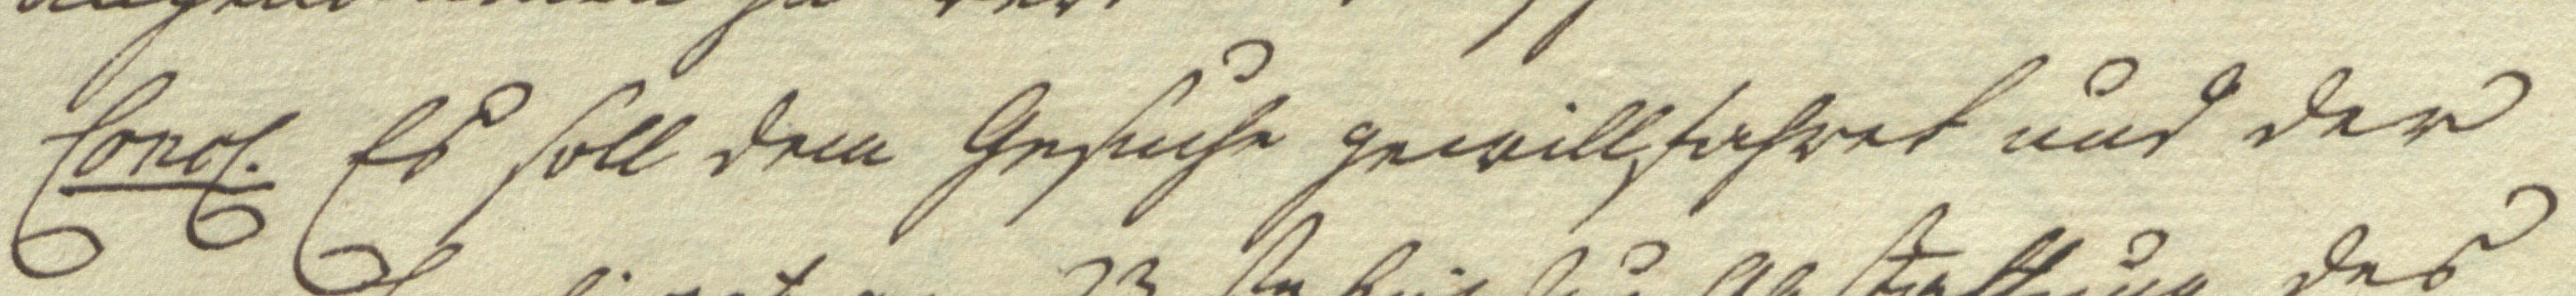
Concl. Es soll dem Gesuche gewillfahret und der
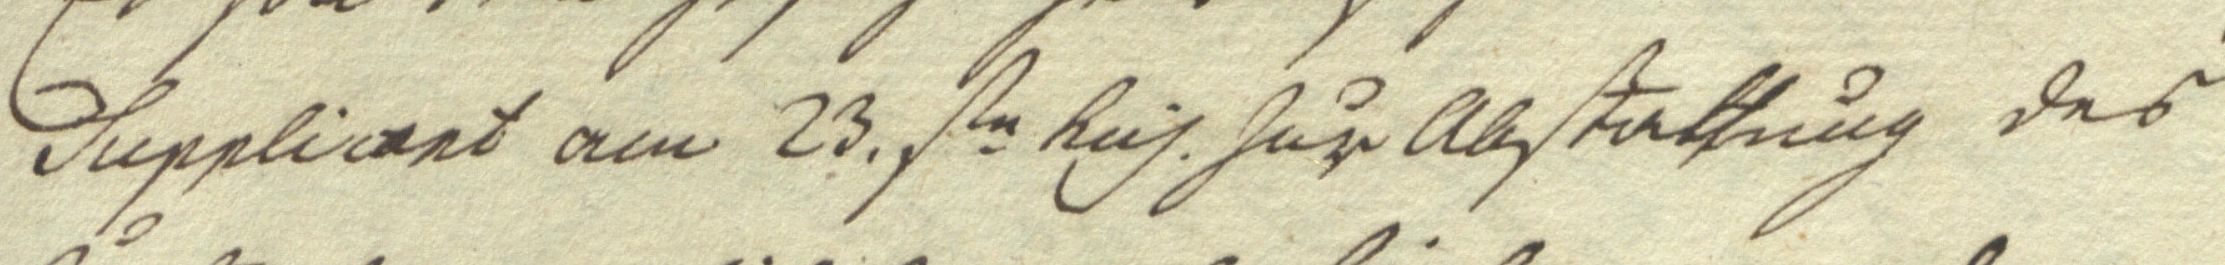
Supplicant am 23. ste huj. zur Abstattung des
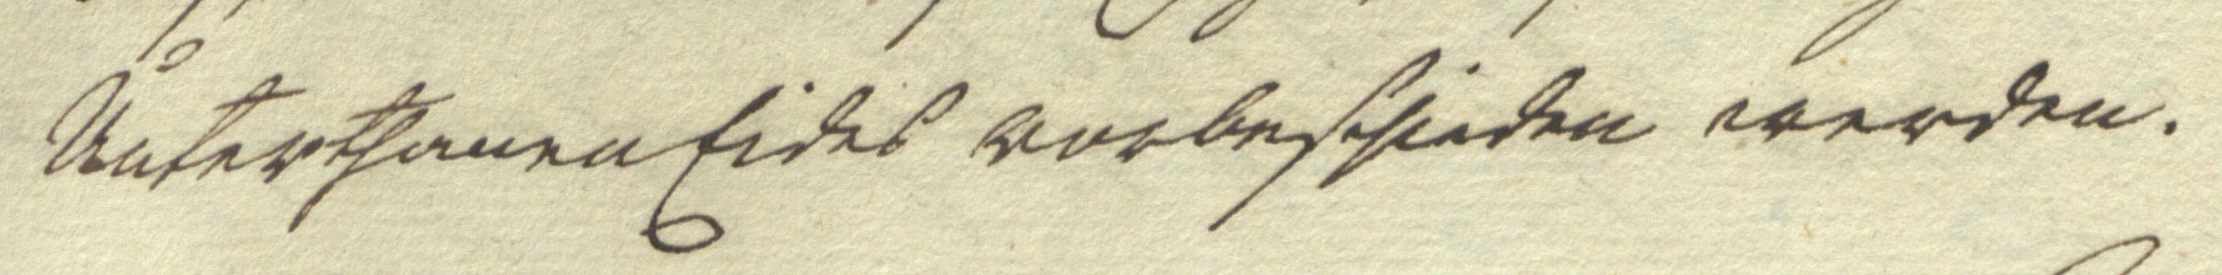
UnterthanenEides vorbeschieden werden.
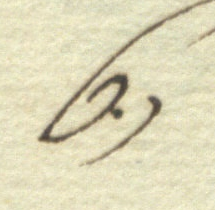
6.,
